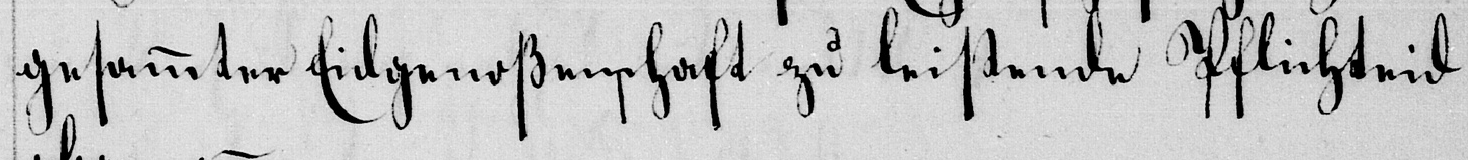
gesammter Eidgenoßenschaft zu leistende Pflichteid
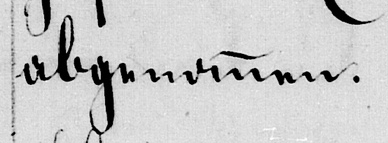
abgenommen.
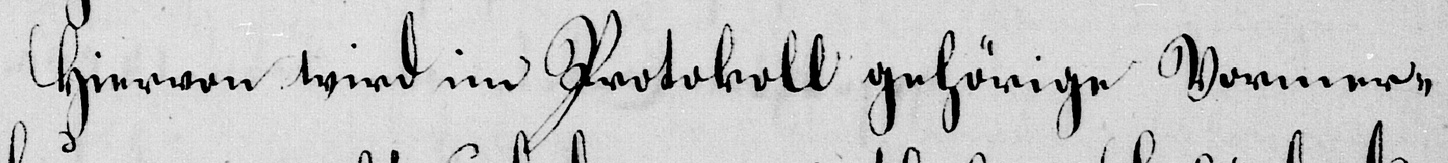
Hiervon wird im Protokoll gehörige Vormer¬
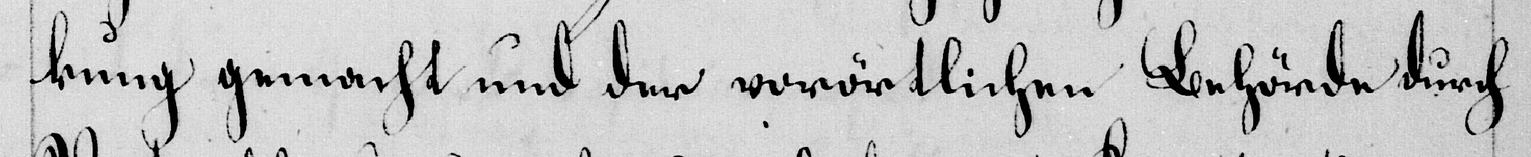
kung gemacht und der vorörtlichen Behörde durch
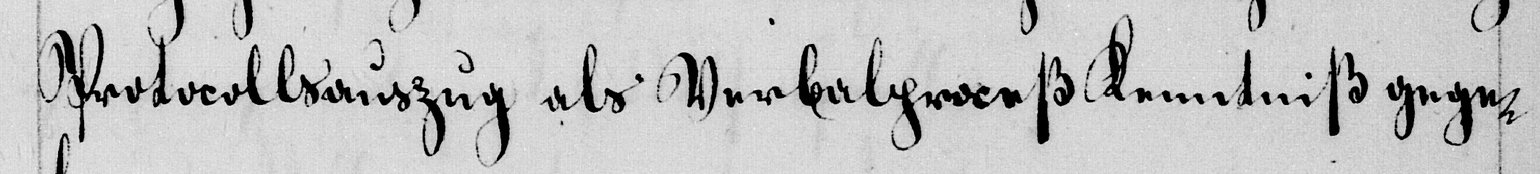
Protokollsauszug als Verbalproceß Kenntniß gege¬
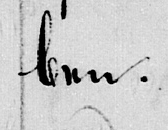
ben.
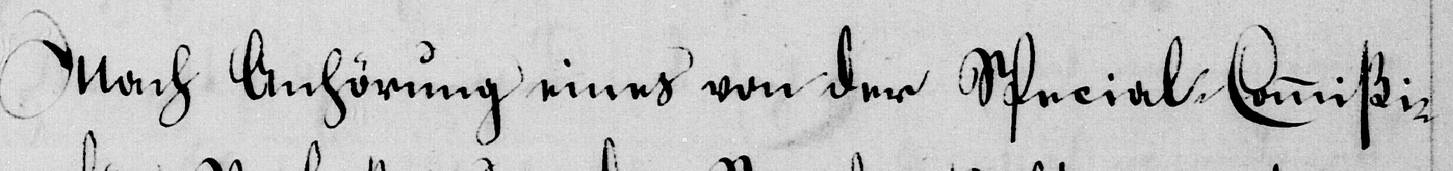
Nach Anhörung eines von der Special-Commißi¬
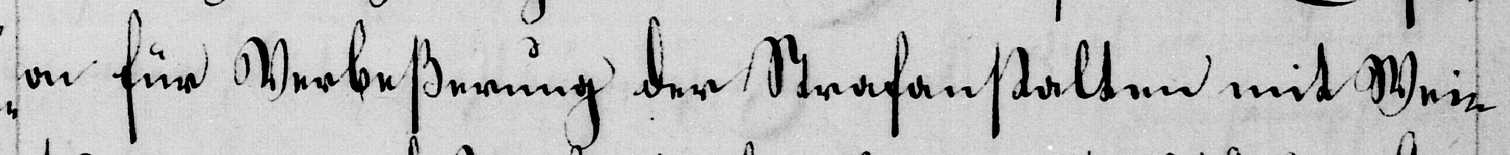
on für Verbeßerung der Strafanstalten mit Wei¬
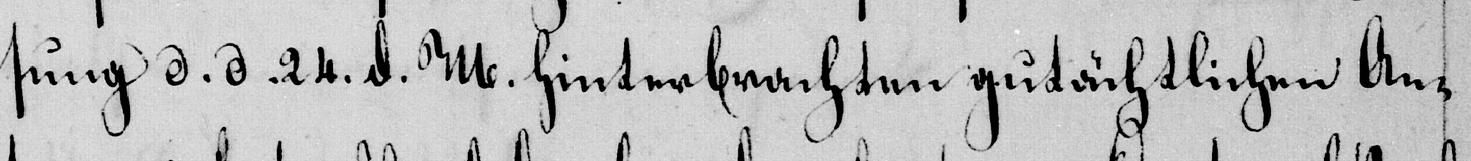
sung d. d. 24. d. M. hinterbrachten gutächtlichen An¬
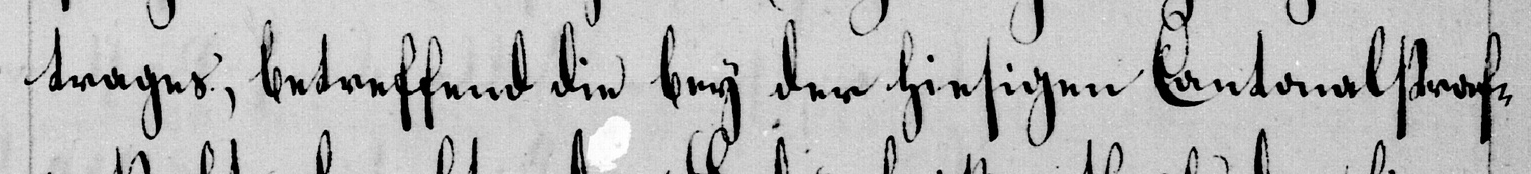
trages, betreffend die bey der hiesigen Cantonalstraf¬
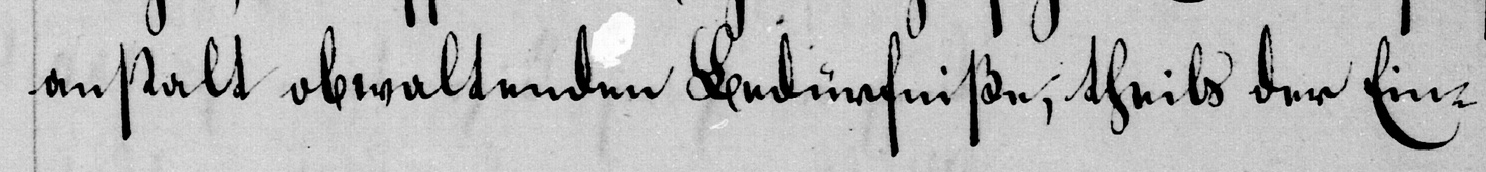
anstalt obwaltenden Bedürfniße, theils der Ein-
